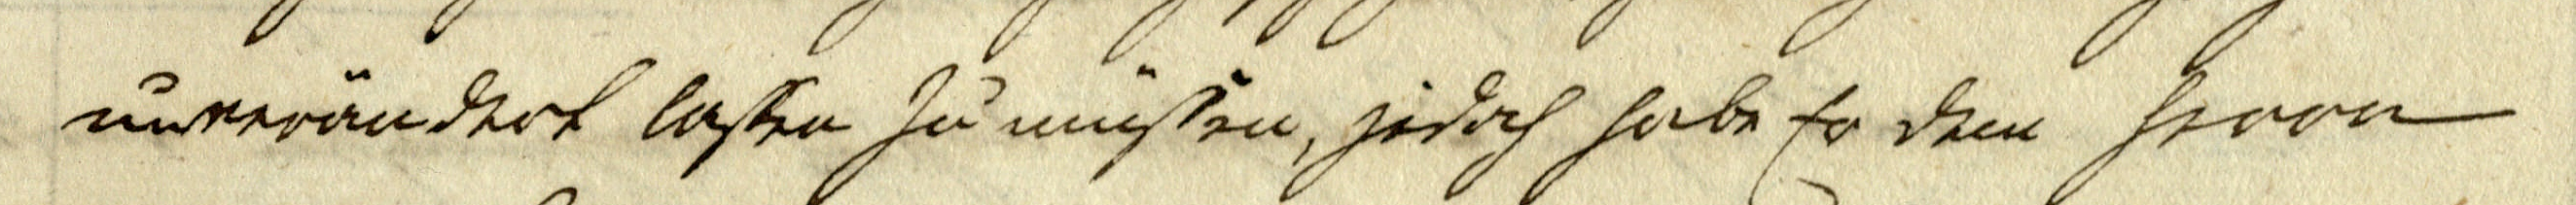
unverändert lassen zu müssen, jedoch habe Er dem herrn
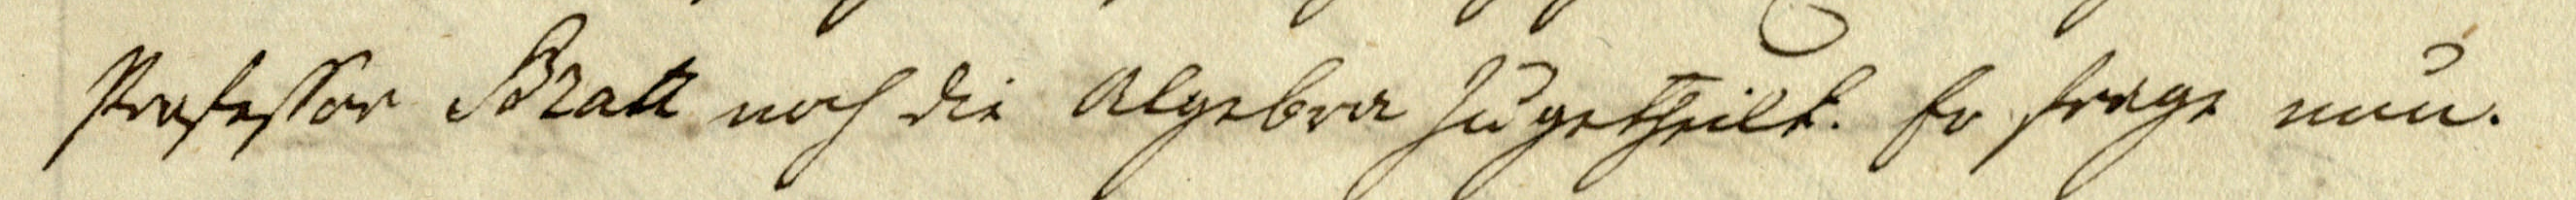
Professor Bratt noch die Algebra zugetheilt. Er fragt nun¬
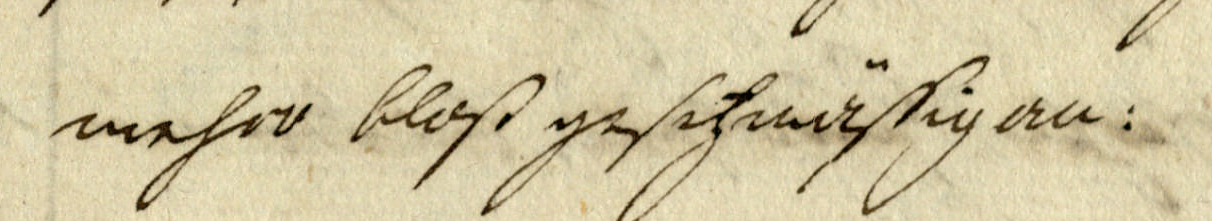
mehro bloß gesetzmäßig an:
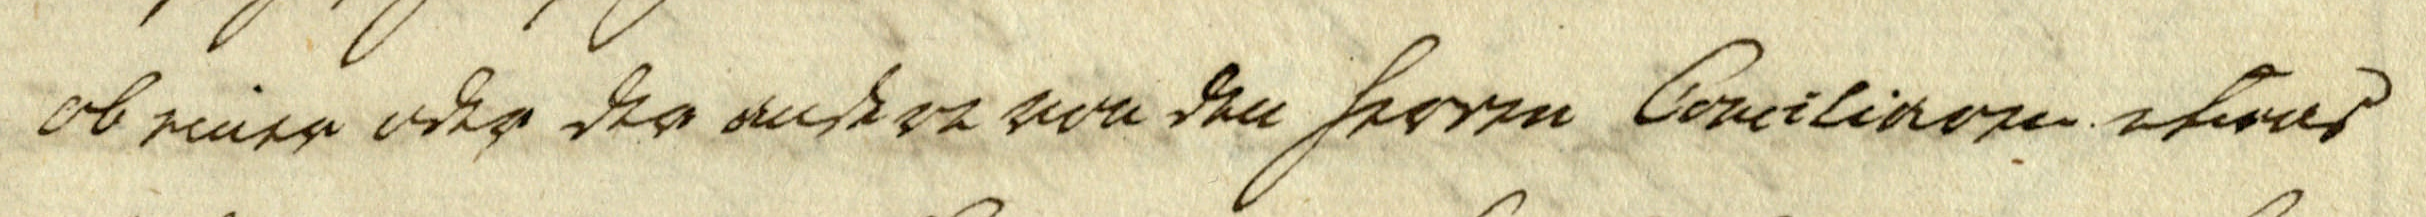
ob einer oder andere von den herrn Conciliaren etwas
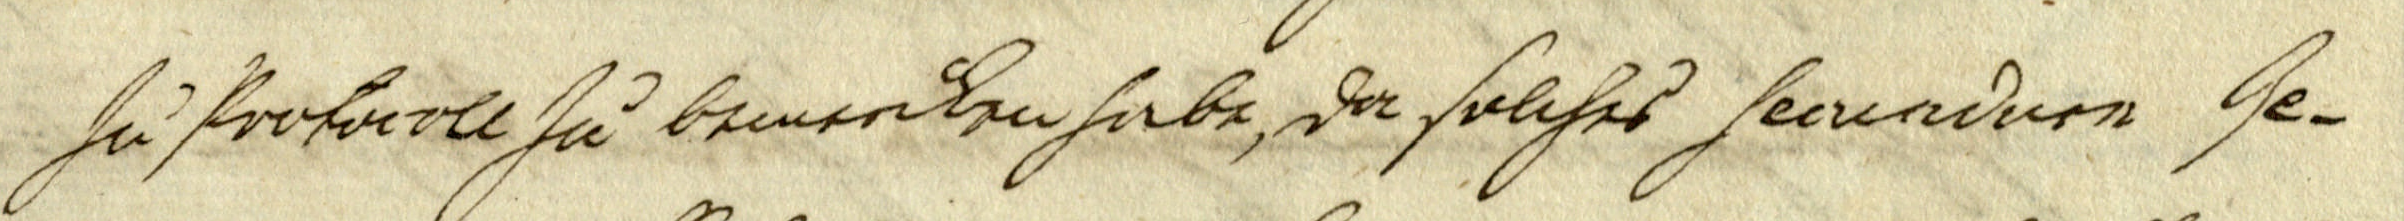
zu Protocoll zu bemercken habe, da solches secundum Re¬
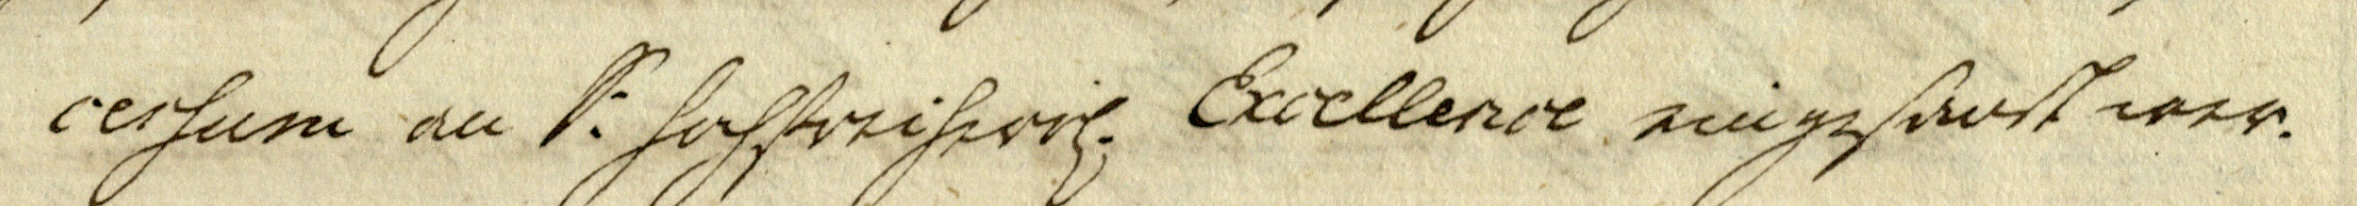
cessum an S. hochfreiherrl. Excellence eingesandt wer¬
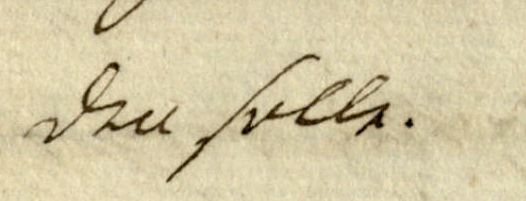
den solle.
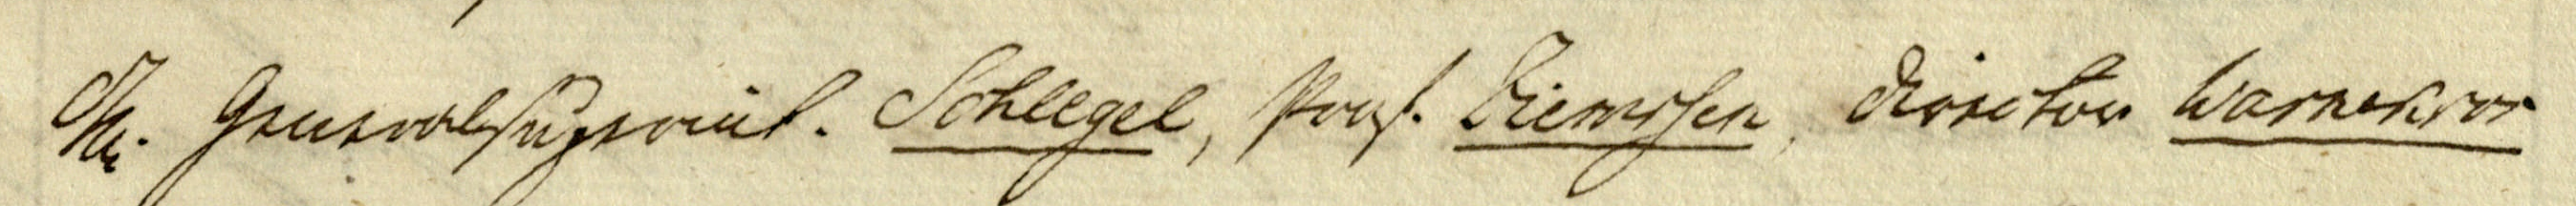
dh. Generalsuperint. Schlegel, Prof. Ziemssen, Director Warnekros
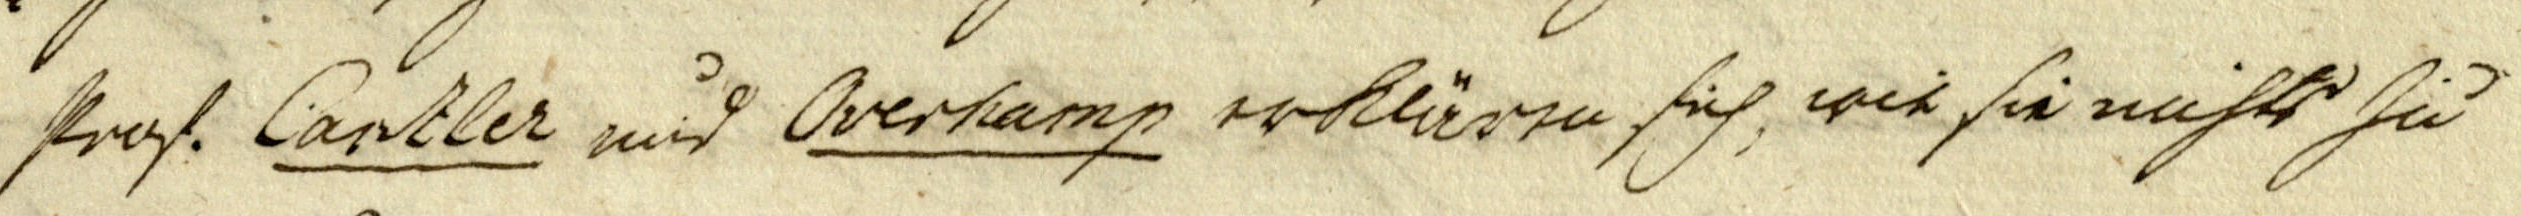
Prof. Canzler und Overkamp erklären sich, wie sie nichts zu
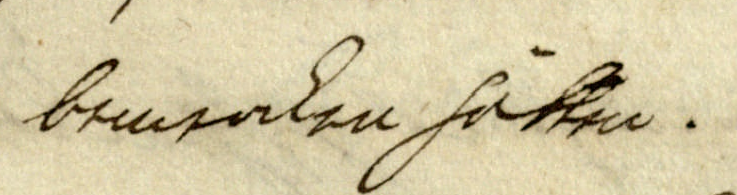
bemercken hätten.
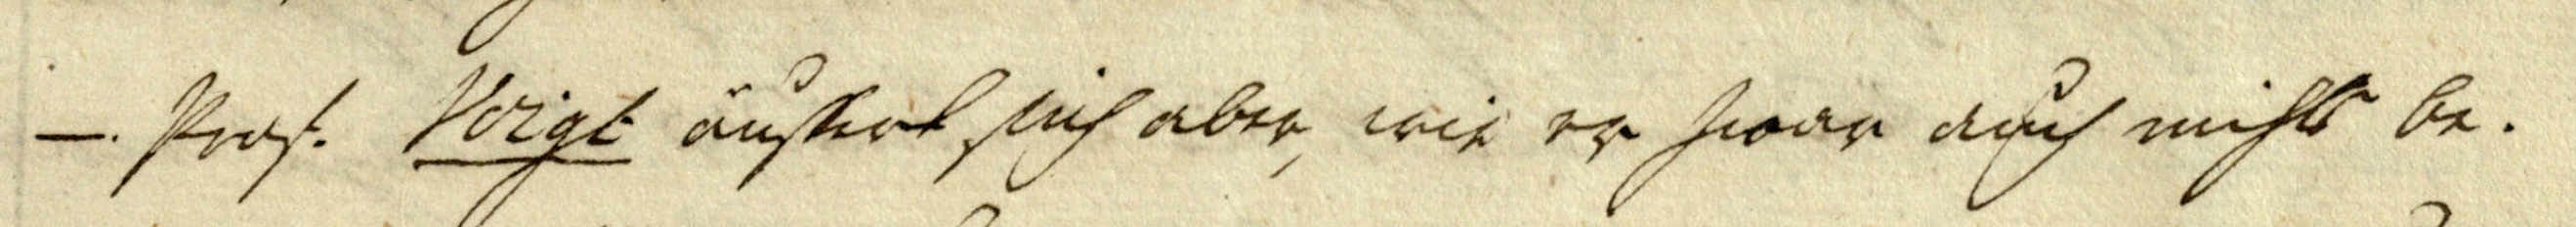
Prof. Voigt äussert sich aber, wie er zwar auch nichts be¬
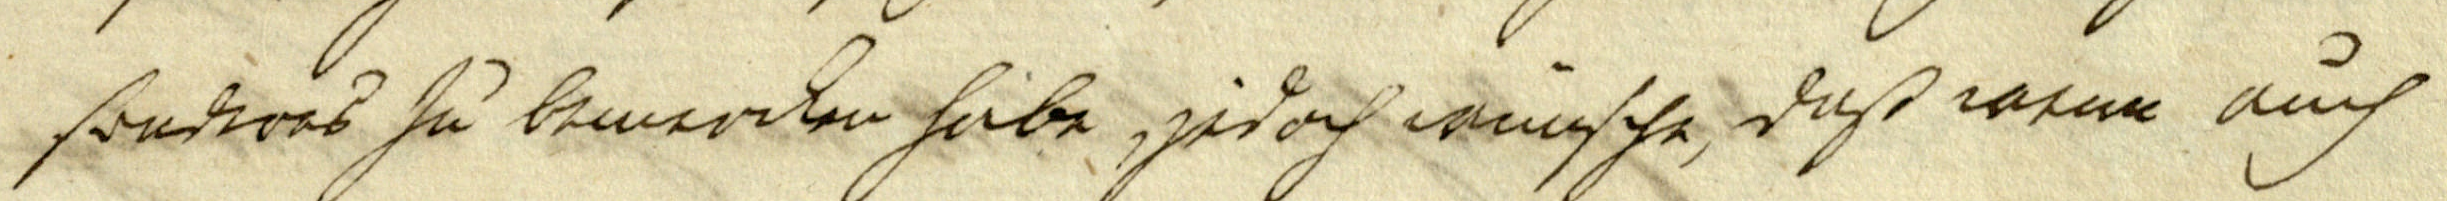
sonders zu bemercken habe, jedoch wünsche, daß wenn auch
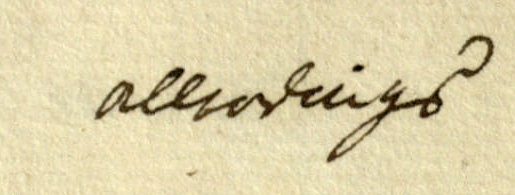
allerdings
